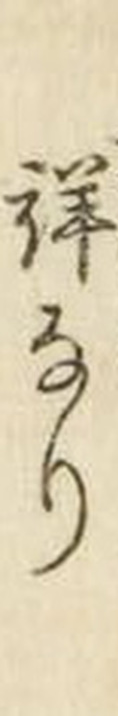詳なり

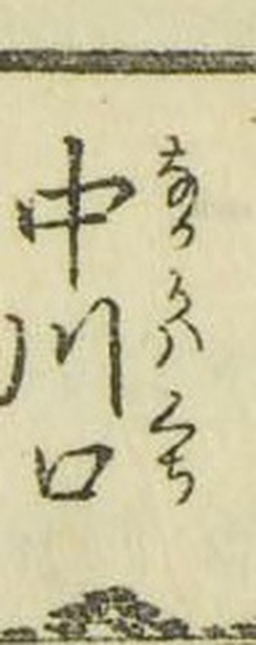中川口

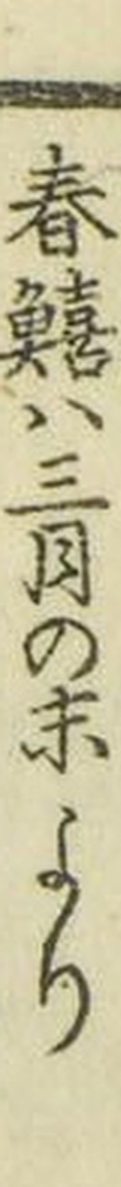春鱚は三月の末より
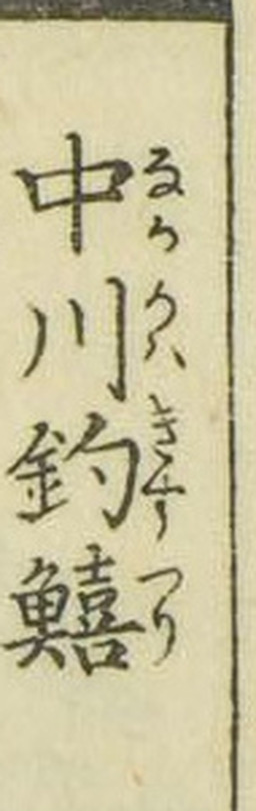中川釣鱚
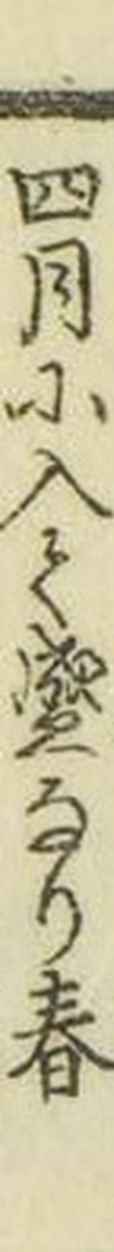四月に入て盛なり春
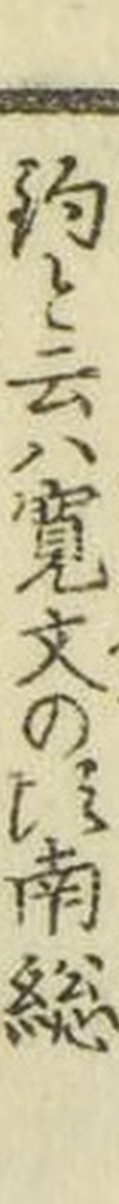釣と云は寛文の頃南総
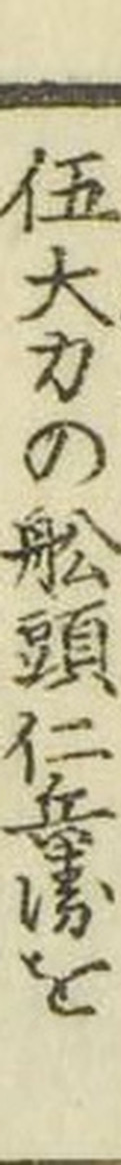伍大力の船頭仁兵衛を
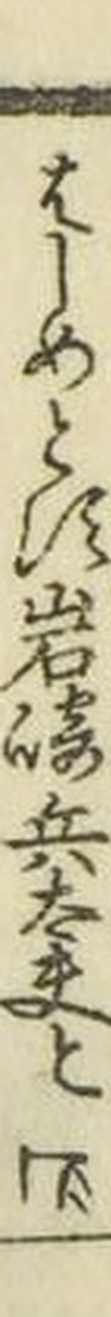はしめとす岩崎兵太夫と
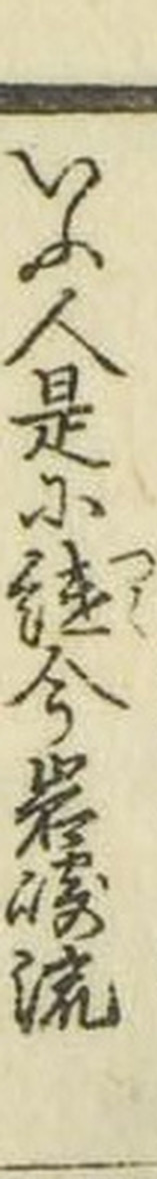いふ人是に継今岩崎流
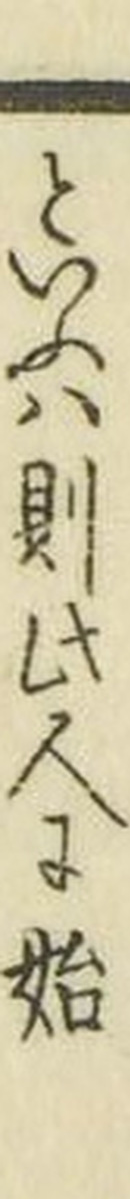といふは則此人に始
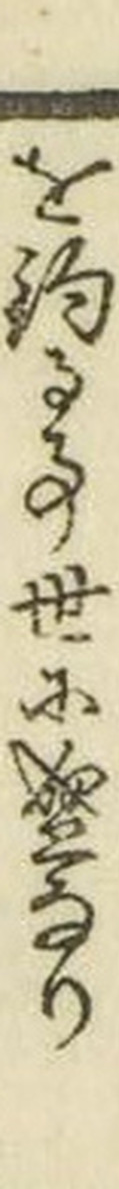を釣る事世に盛なり
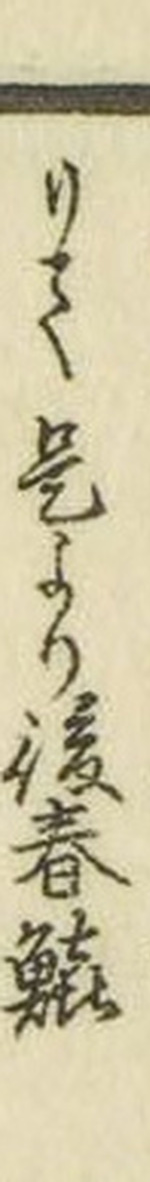りて是より後春鱚
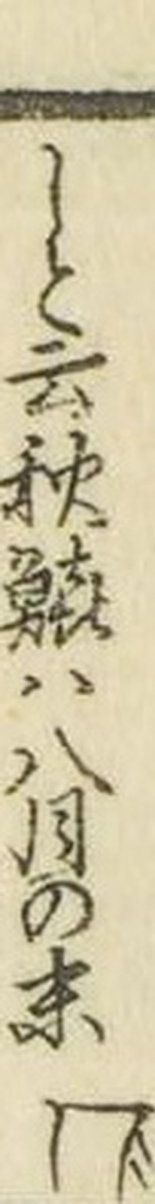しと云秋鱚は八月の末
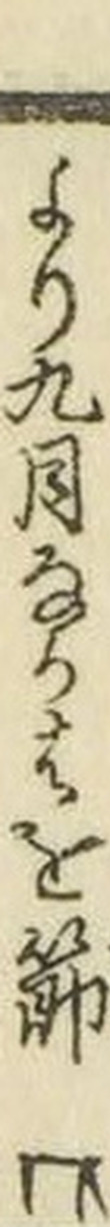より九月なかはを節
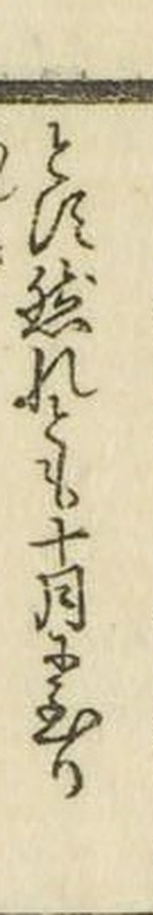とす然れとも十月に至り
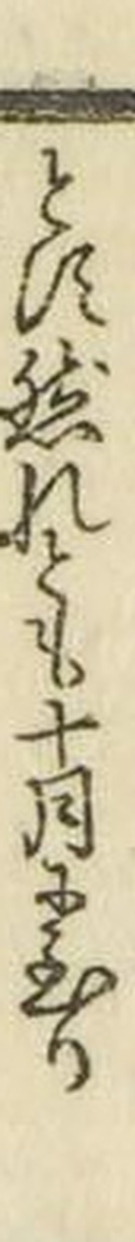とす然れとも十月に至り
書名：江戸名所図会 20巻 巻之19
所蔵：東京学芸大学教育コンテンツアーカイブ
